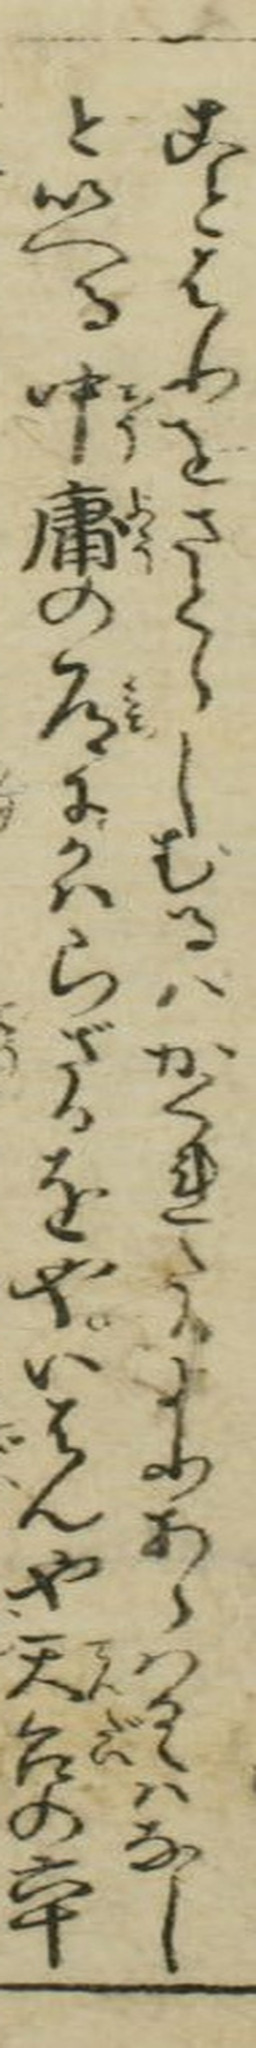といへる中庸の道にかはらざるをや。いはんや天台の六十
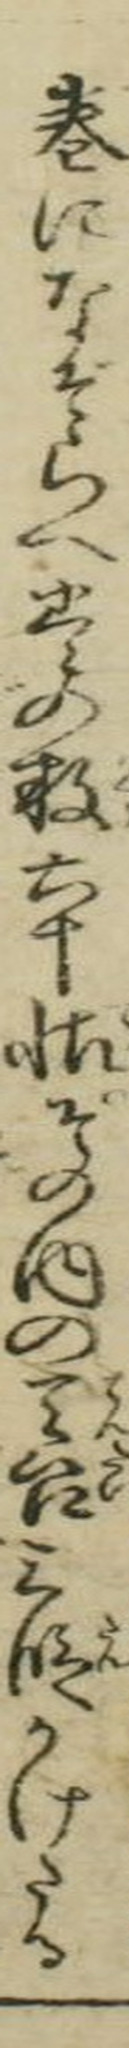巻になぞらへ巻の数六十帖。その内の天台三段かけたる
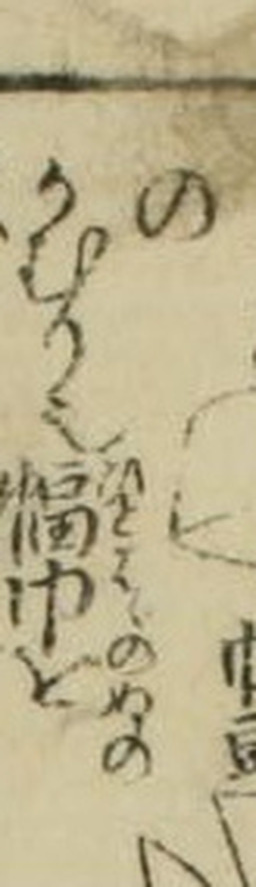かむり也幅巾を
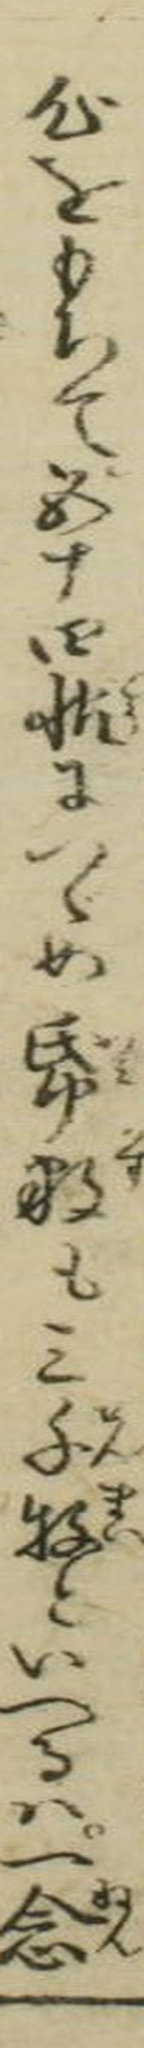心をもちて。五十四帖につゞめ紙数も三千枚といへるは。一念
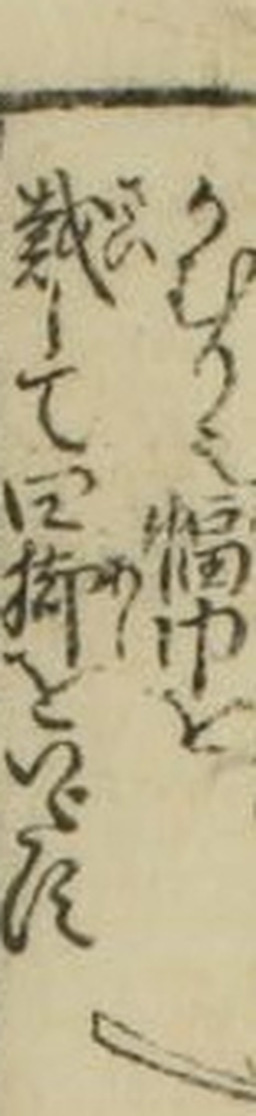裁して四脚をいだす
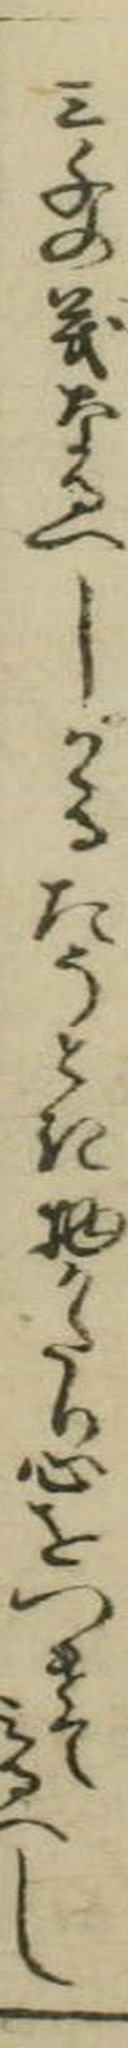三千の義なるへし。かゝるたうとき物かたり心をつけてみるへし
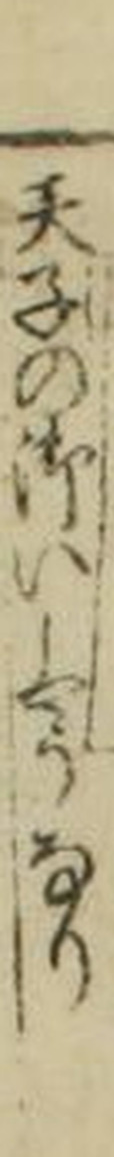天子の御いしやうなり
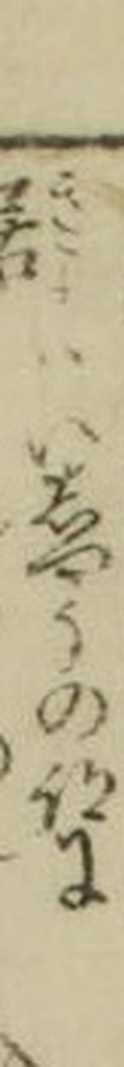裾はいしやうの跡に
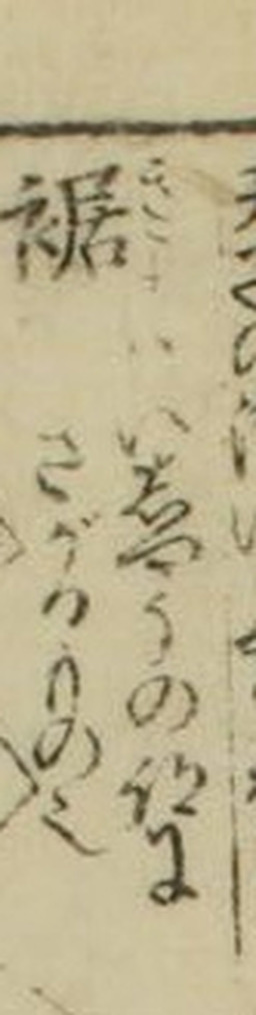さがるもの也
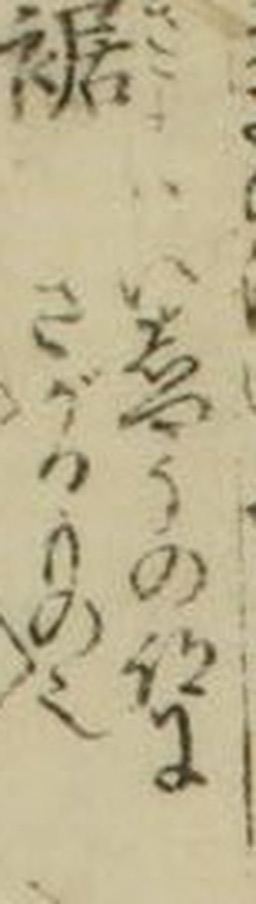さがるもの也
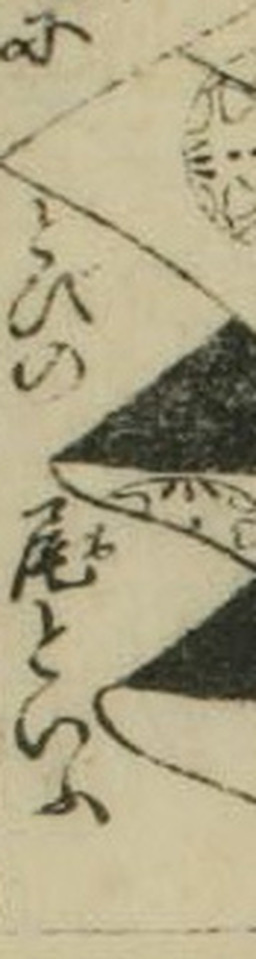俗にとびの尾といふ
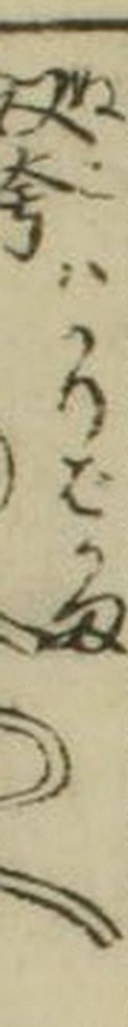奴袴はかりばかま
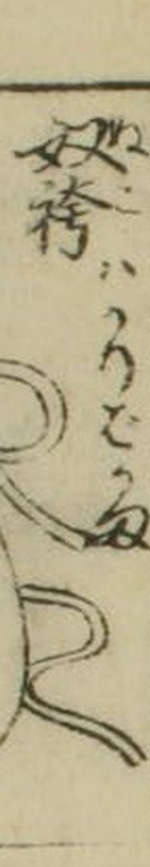奴袴はかりばかま
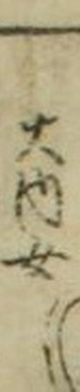大内女
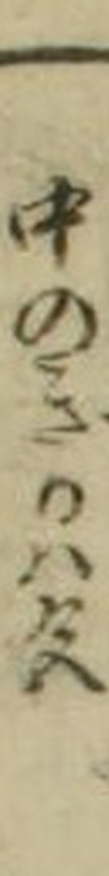中のきるは色
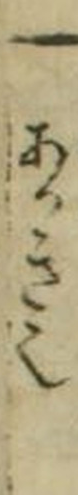あかき也
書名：女源氏教訓鑑
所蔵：東京学芸大学附属図書館
